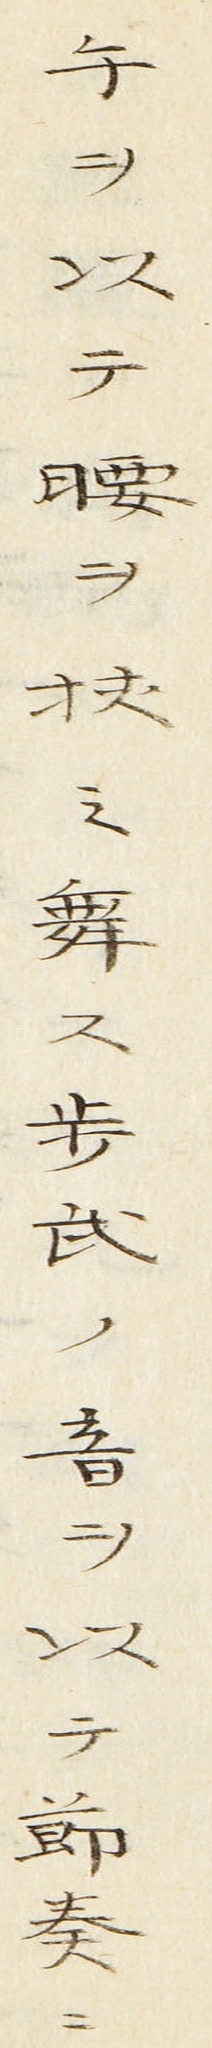手ヲ以テ腰ヲ挟ミ舞ス歩武？ノ音ヲ以テ節奏ニ
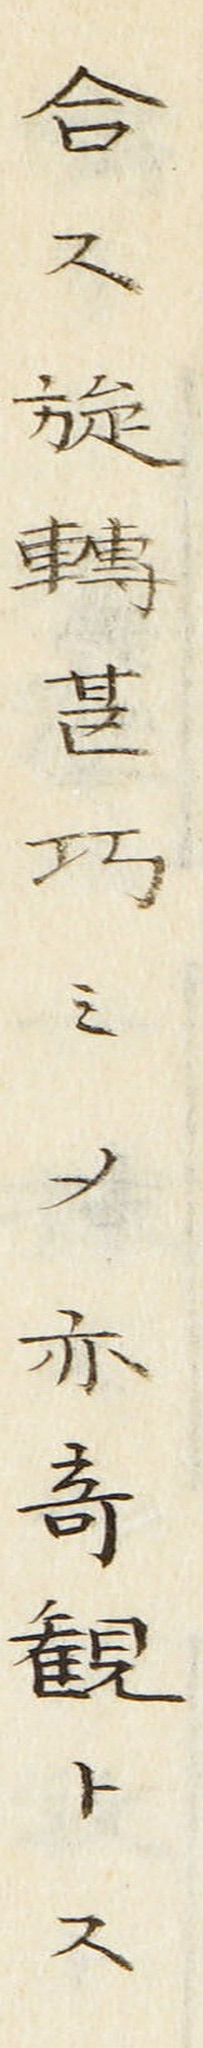合ス旋転甚巧ミシテ亦奇観トス
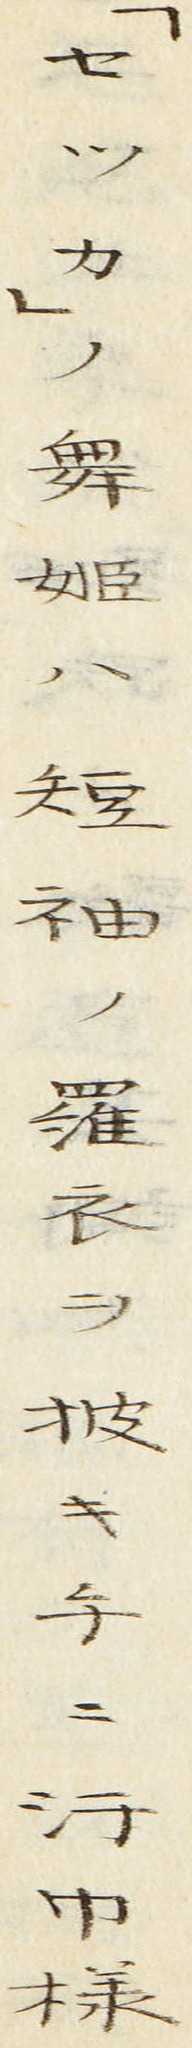「セツカ」ノ舞姫ハ短袖ノ羅衣ヲ披キ手ニ汗巾様
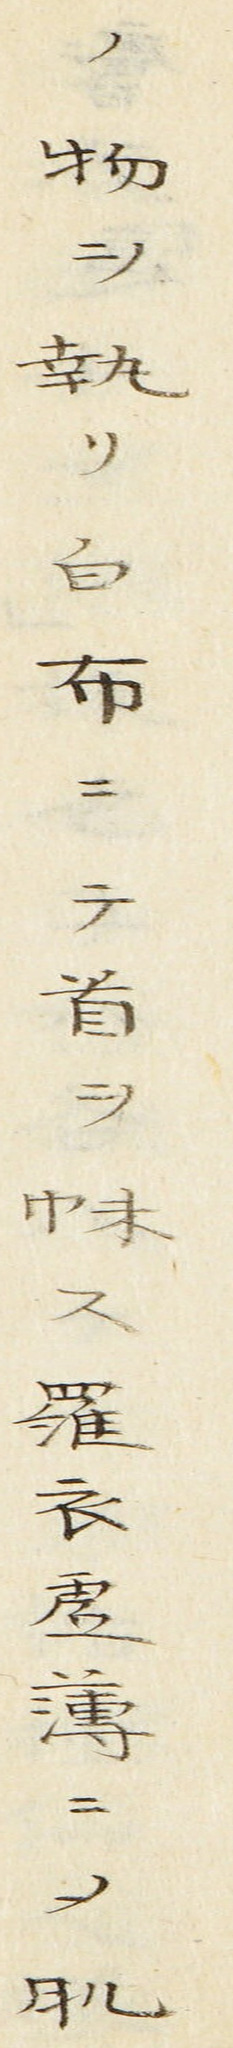ノ物ヲ執リ白布ニテ首ヲ帓ス羅衣虗薄ニシテ肌

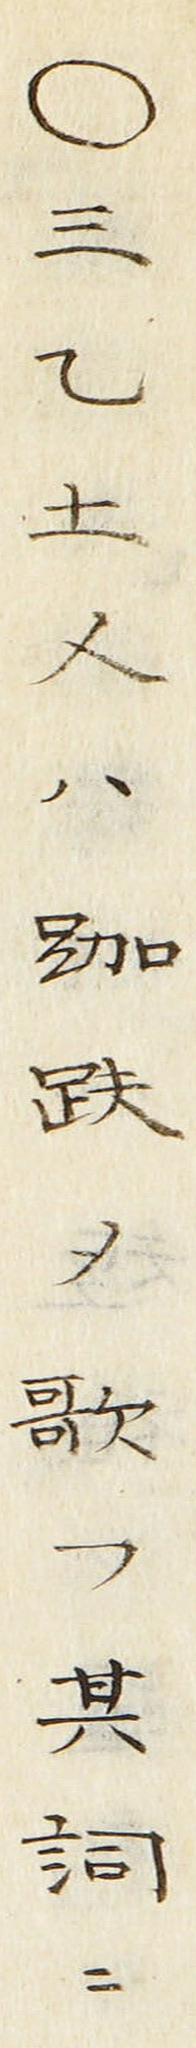〇三乙土人ハ跏趺シテ歌フ其詞ニ
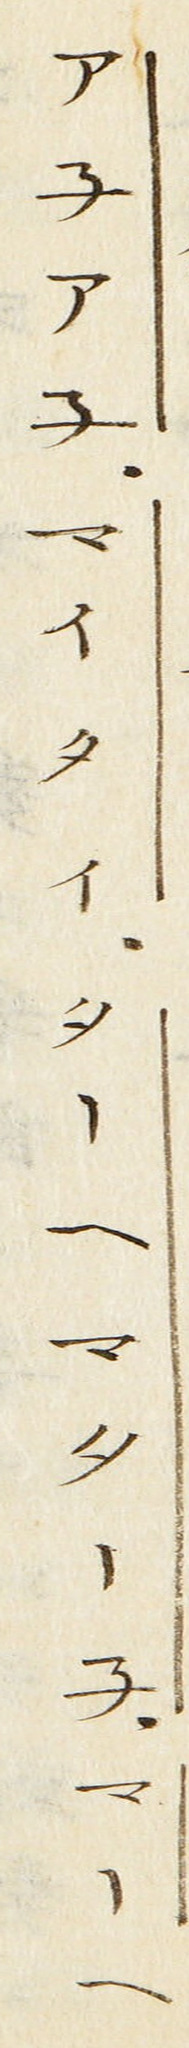アネアネ．マイタイ．ターヘマターネ．マーヘ
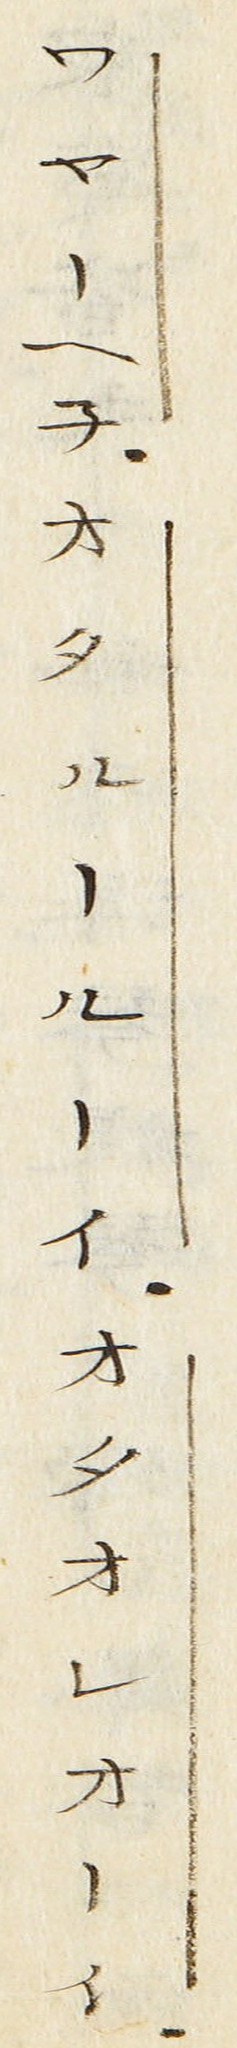ワヤーヘネ．オタルールーイ．オタオレオーイ．
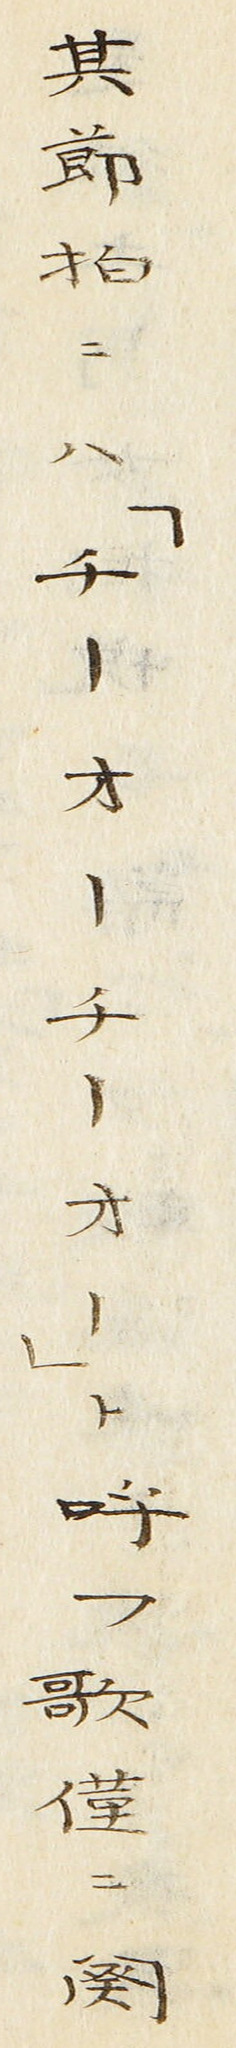其節拍ニハ「チーオーチーオー」ト呼フ歌僅ニ闋
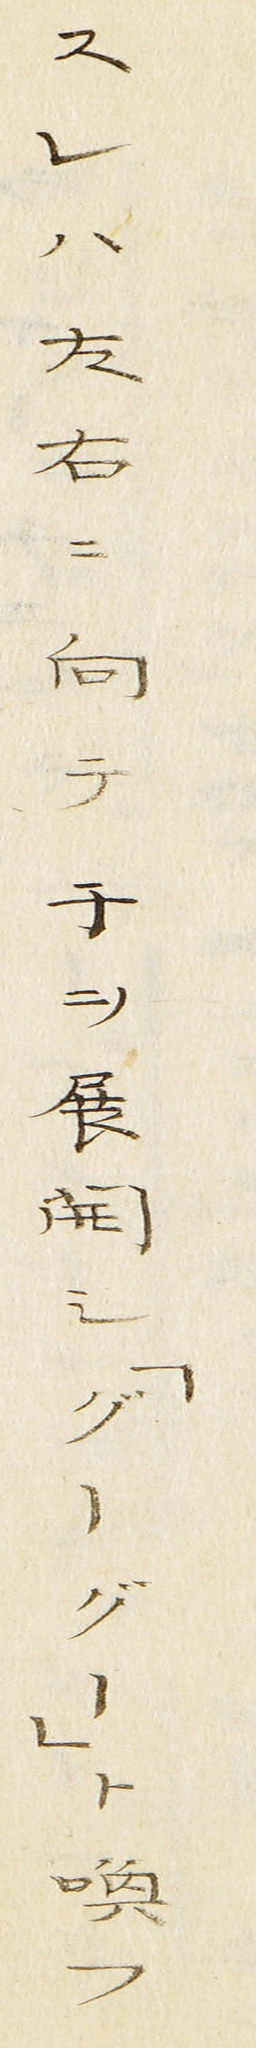スレハ左右ニ向テ于ヲ展開シ「グーグー」ト喚フ
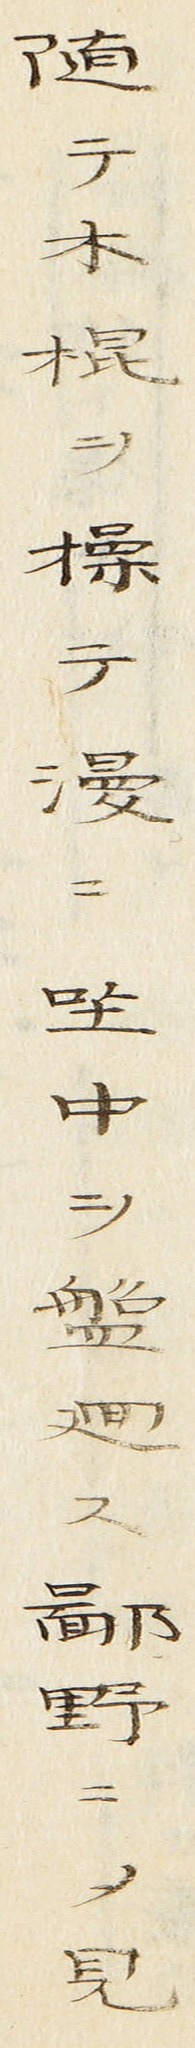随テ木棍ヲ操テ漫ニ坐中ヲ盤廻ス鄙野ニシテ見
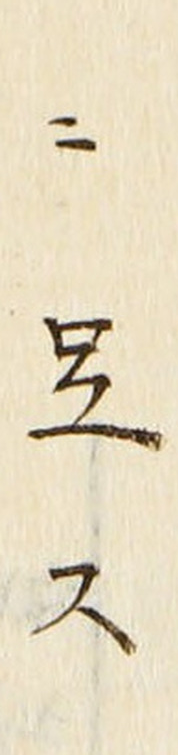ニ足ス
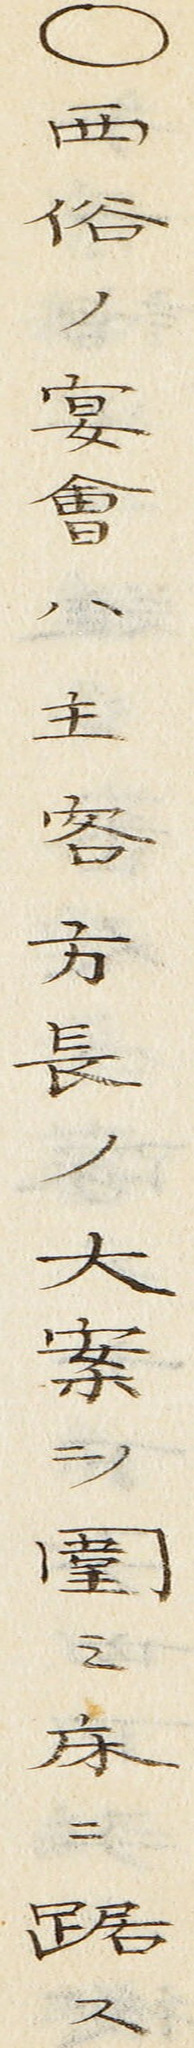〇西俗ノ宴会ハ主客方長ノ大案ヲ囲ミ床ニ踞ス
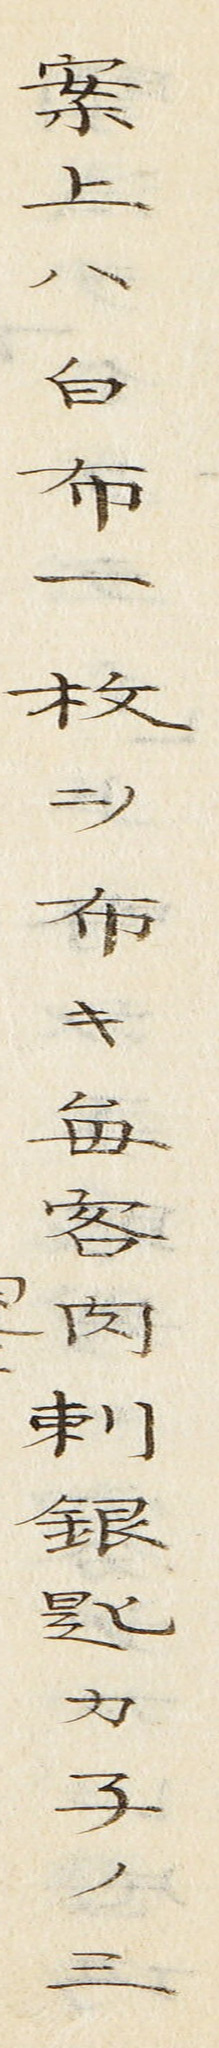案上ハ白布一枚ヲ布キ毎客肉刺銀匙カネノ三
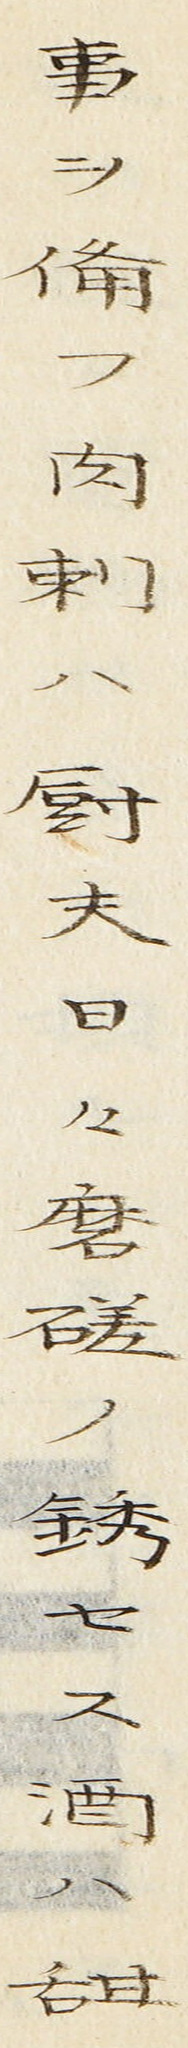事ヲ備フ肉刺ハ厨夫日々磨磋ノ銹セス酒ハ甜
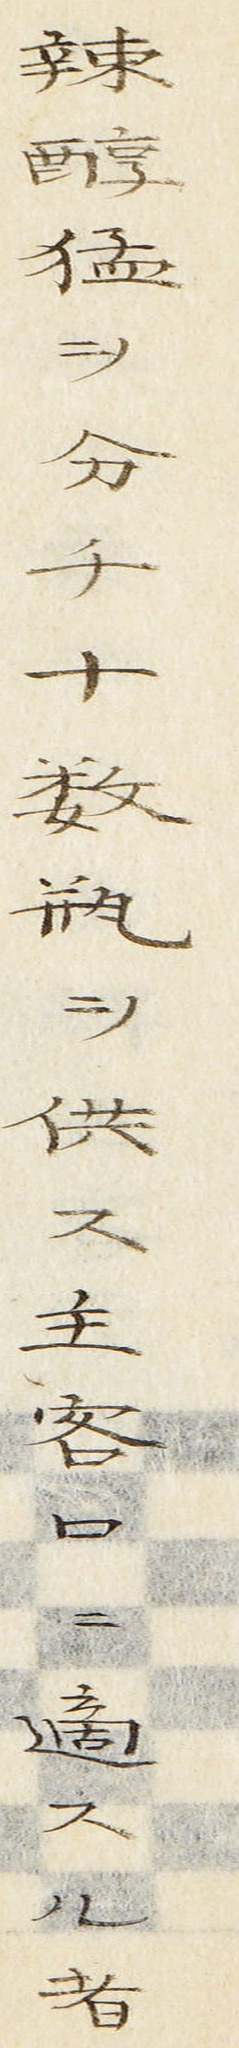辣醇猛ヲ分チ十数瓶ヲ供ス主客口ニ適スル者
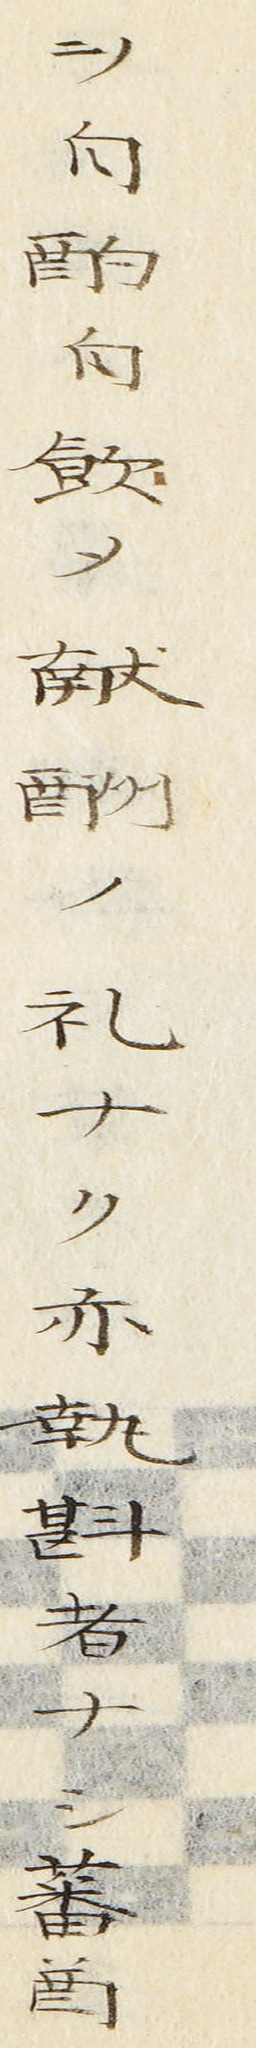ヲ自酌自飲シテ献酬ノ礼ナク亦執斟者ナシ蕃酋
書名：蕃談
